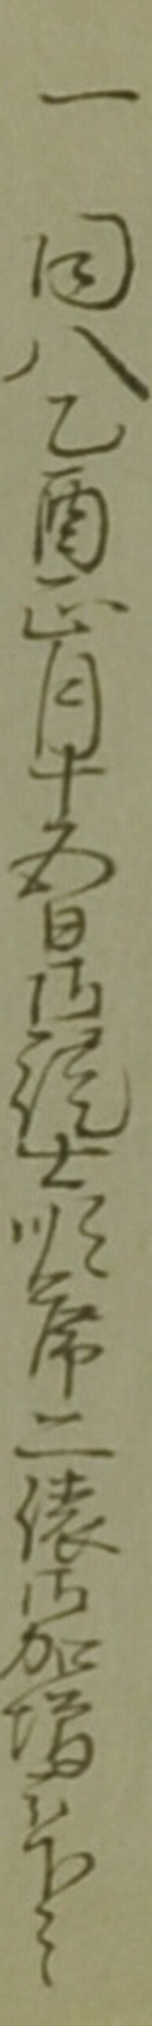一同八乙酉正月十五日御徒士順席二俵御加増被下之
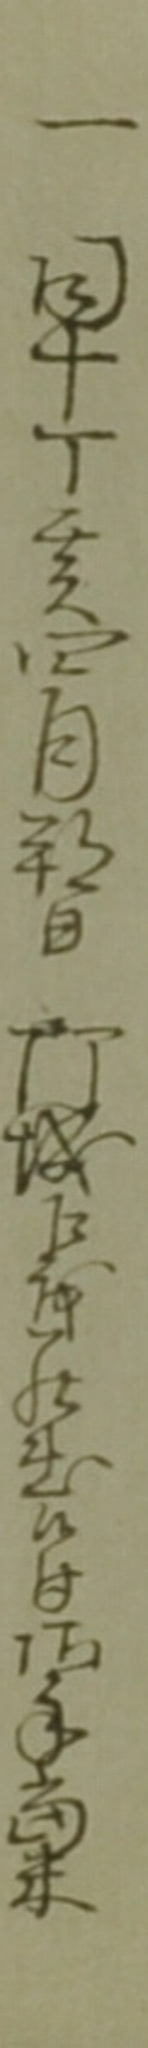一同十丁亥四月朔日御城江茂罷出候付御手当米
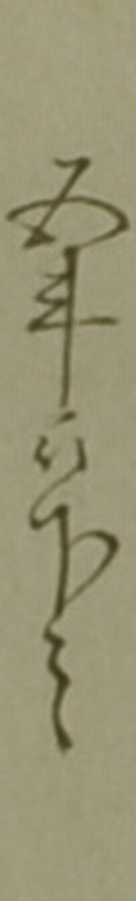五斗被下之
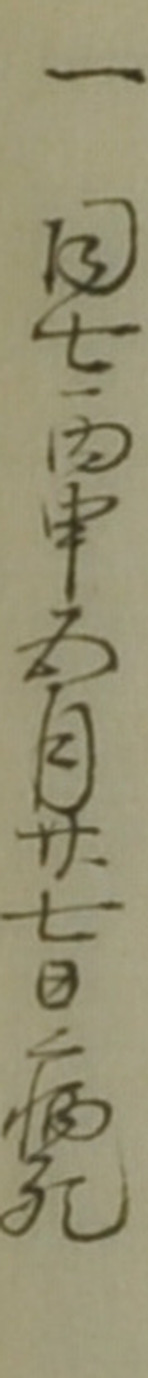一同七丙申五月廿七日病死
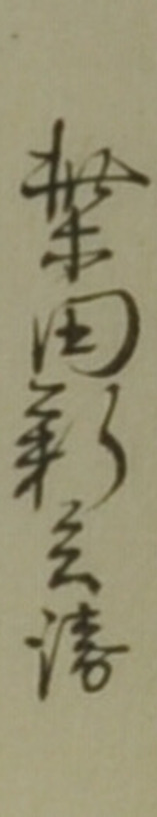柴田新兵衛
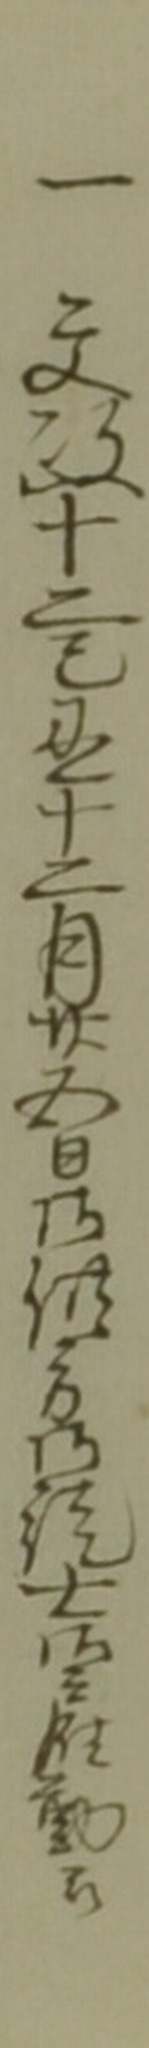一文政十二己丑十二月廿五日御供方御徒士御雇勤被
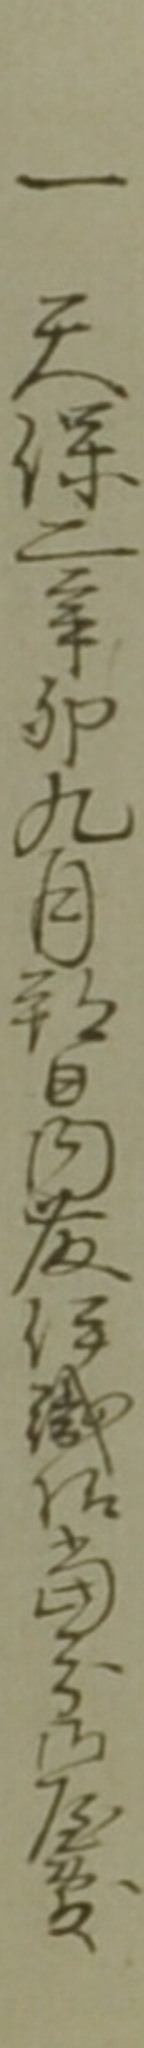一天保二辛卯九月朔日内藤伊織様当分御屋敷
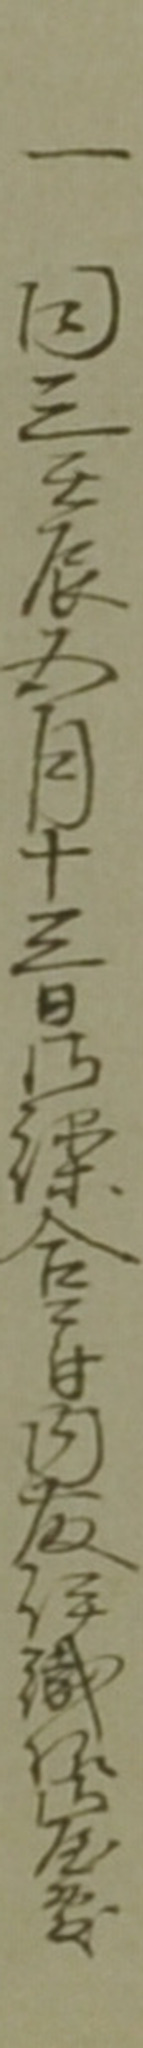一同三壬辰五月十三日御繰合ニ付内藤伊織様御屋敷
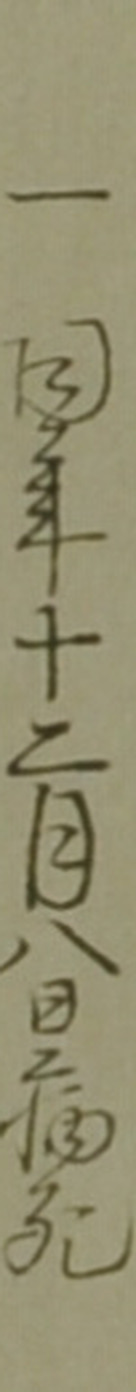一同年十二月八日病死
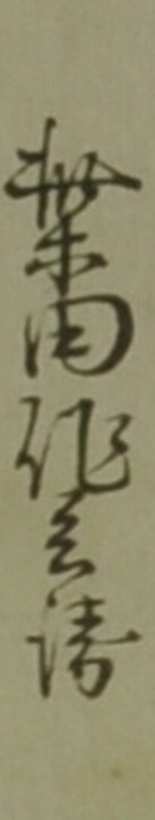柴田作兵衛
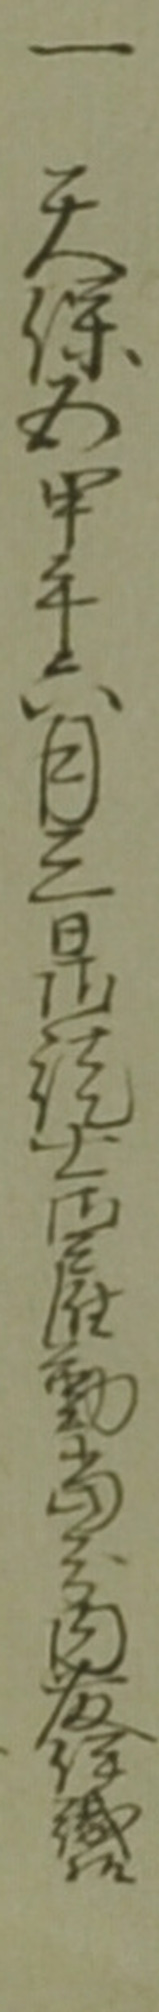一天保五甲午六月三日御徒士御雇勤当分内藤伊織様
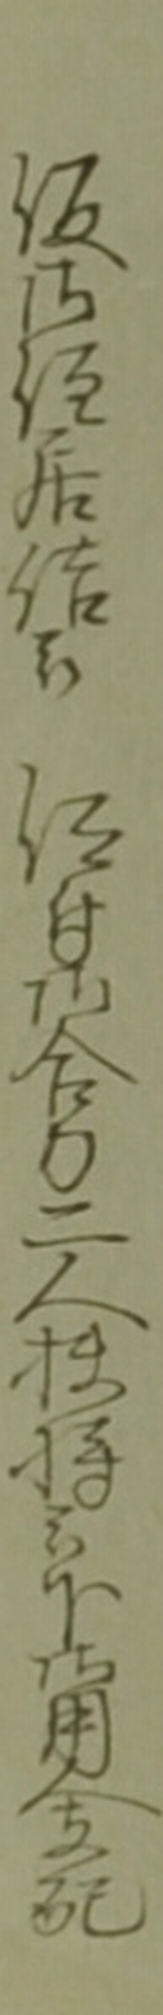仮御住居詰被仰付御合力二人扶持被下御用人支配
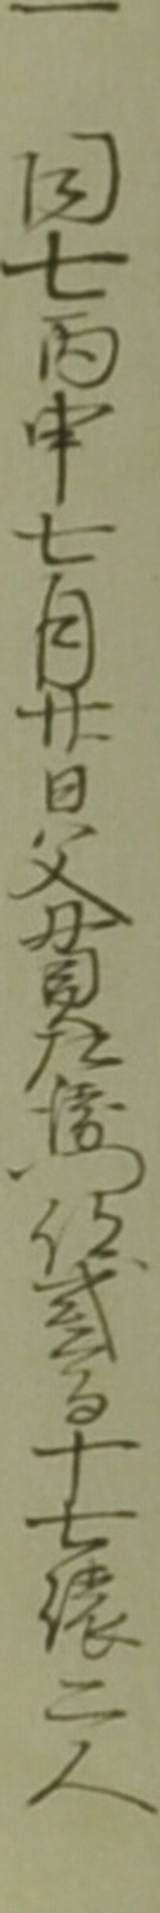一同七丙申七月廿日父貫左衛門跡式高十七俵二人
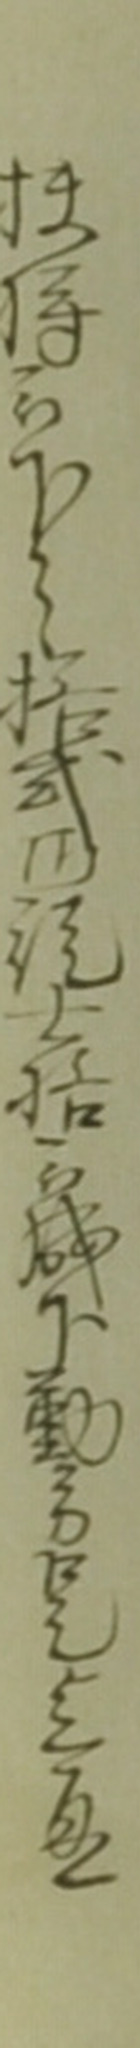扶持被下之格式御徒士格被成下勤方是迄通

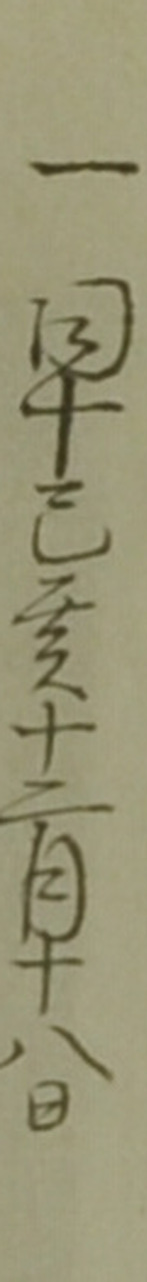一同十己亥十二月十八日
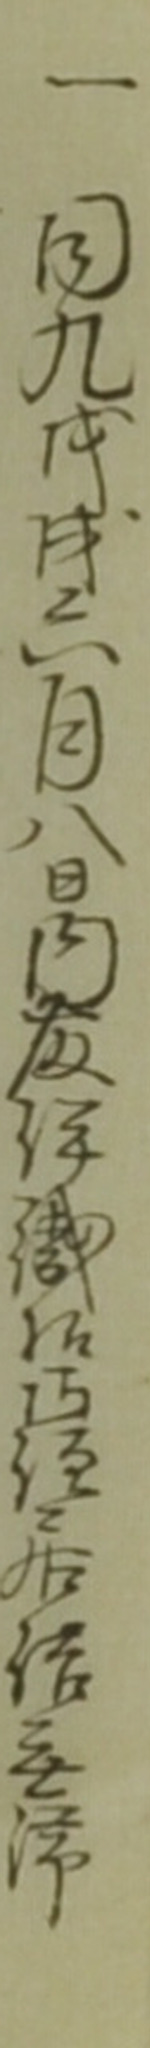一同九戊戌六月八日内藤伊織様御住居詰無滞
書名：無足廃家（弐）
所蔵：伊那市立高遠町図書館・合同会社AMANE
